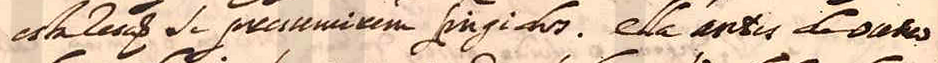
esta Rezaõ se presumirem fingidos. ella antes de outro
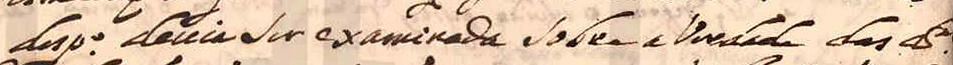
desp.o deuia ser examinada sobre a verdade das d.s
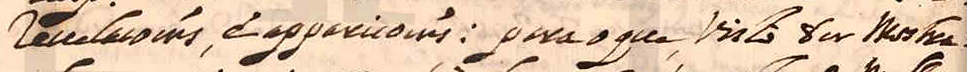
Reuelaçoins, e appariçoins: para o que, visto ter mostra
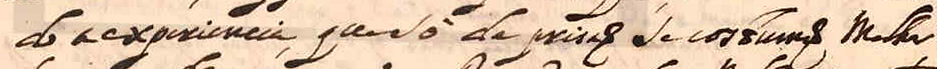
do a experiencia, que só da prisaõ se costumaõ melhor
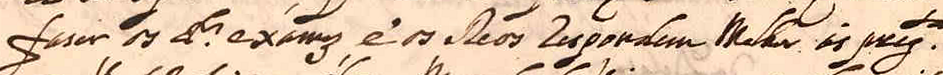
faser os d̄.s examez, e os Reos Respondem Melhor ás preg.tas
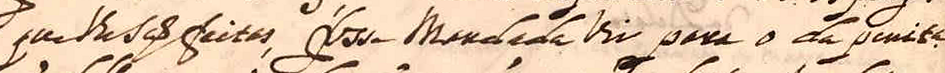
que lhe saõ feitas, fosse mandada vir para o da penit.a
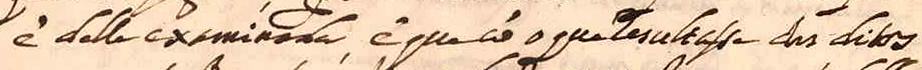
e delle examinada, e que cō o que Resultasse dos ditos
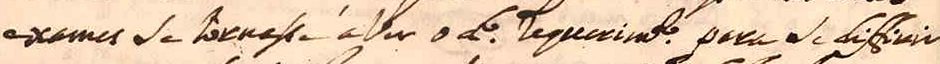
exames se tornasse a ver o d.o Requerim.to para se diffirir
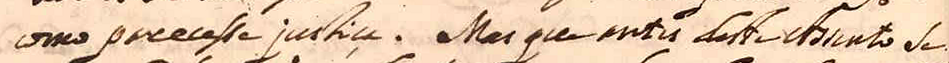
como parecesse justiça. Mas que antes deste Assento se
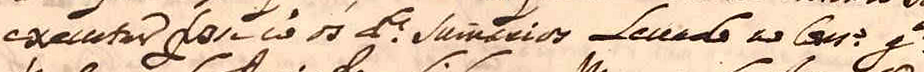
executar fosse cō os d.s sumarios Leuado ao Cons.o g.al
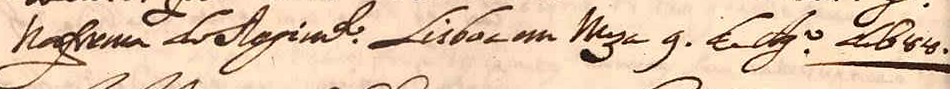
na forma do Regimto. Lisboa em Meza 9. de Ag.o de 688.
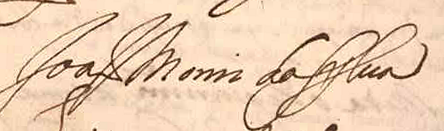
Joaõ Moniz da Sylua
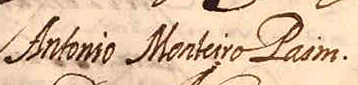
Antonio Monteiro Paim.
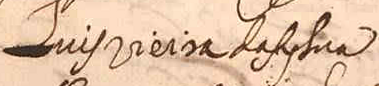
Luis Vieira da Sylua
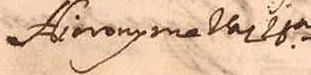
Hieronymo Vaz Vr.a
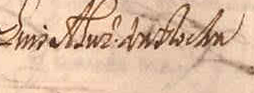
Luis Aluz̄ da Rocha
